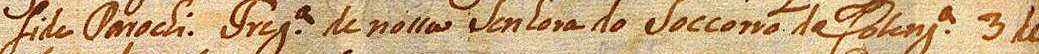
side Parochi. Freg.a de nossa Senhora do Soccorro da Coteng.a 3 de
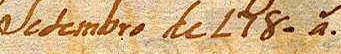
Setembro de 1780 ā.
